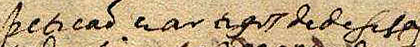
Peticaõ e artigos de desista
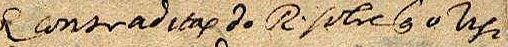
E contraditas do R. sobre q̄ o Visi
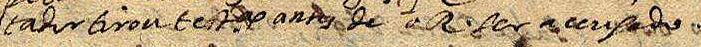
tador tirou test.as antes de o R. ser accusado
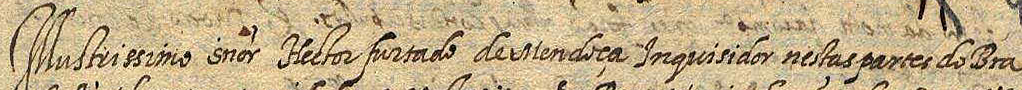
Jllustrissimo snor̄ Hector furtado de Mendoça Inquisidor nestas partes do Bra
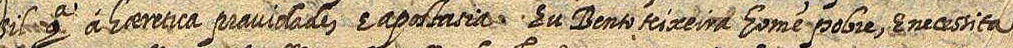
sil ꝯa á hæretica prauidade, E apostasia. Eu Bento teixeira homē pobre, E necessita
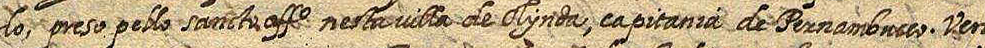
do, preso pello sancto offo nesta uilla de Olynda, capitania de Pernambucco. Ven
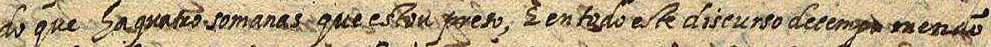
do que a quatro somanas que estou preso, E en todo este discurso de tempo me naõ
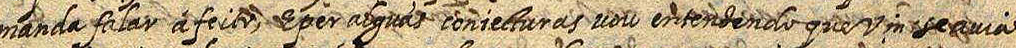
manda falar a feito, E per alguās coniecturas uou entendendo que V m. se auia
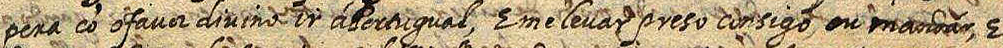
pera cō o fauor diuino ir á Portugual, E me leuar preso consigo ou mandar, E
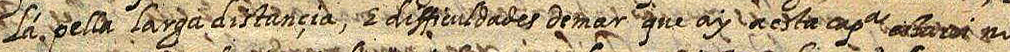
Lá pella larga distançia, E difficuldades de mar que ay a esta capa estarei no
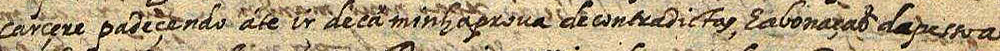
carçere padecendo áte ir de ca minha proua de contradictas, E abonaçaõ da pessoa
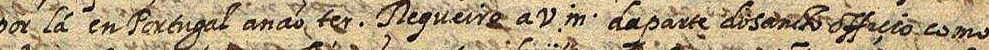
por lá en Portugal a naõ ter. Requeiro a V. m. da parte do sancto offiçio como
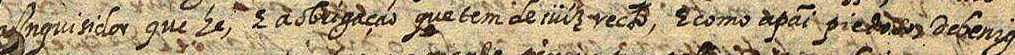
a Jnquisidor que he, E a obrigaçaõ que tem de iuiz recto, E como a pāi piedoso de benig
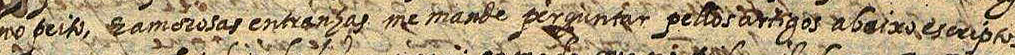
no peito, E amorosas entranhas me mande perguntar pellos artigos abaixo escriptos
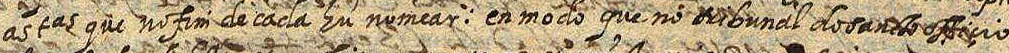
as tas que no fim de cada hū nomear: en modo que no tribunal do sancto offiçio
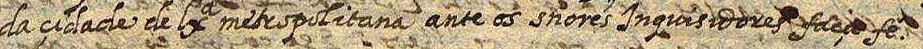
da çidade de lxa metropolitana ante os snores̄ Inquisidores faça fé.
